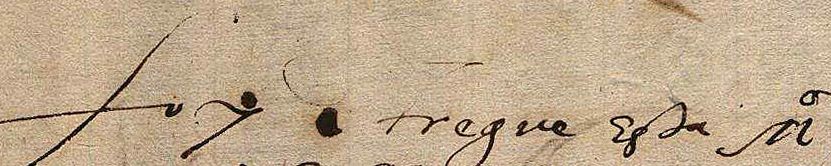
Foy e̅tregue Esta Ma
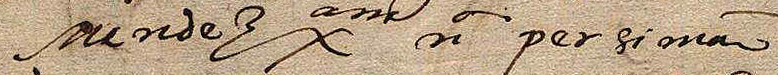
Mendez xam na per simão
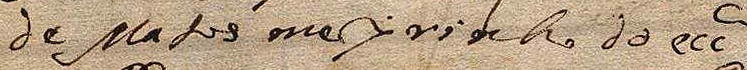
de Matos meyrinho do eccco
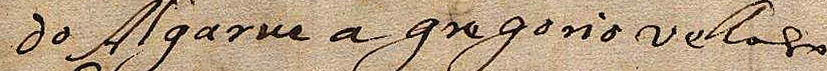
do Algarue a gregorio velloso
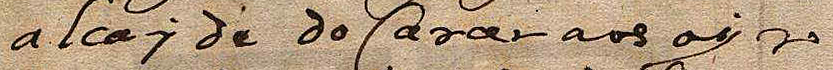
alcayde do Carcer aos oyto
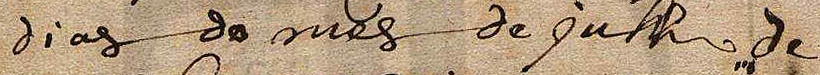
dias do mes de julho de
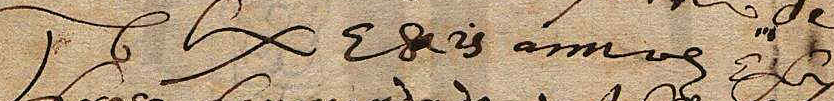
jblx E seis annos E foy
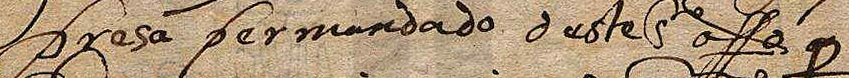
presa per mandado deste Sto offo ꝑ
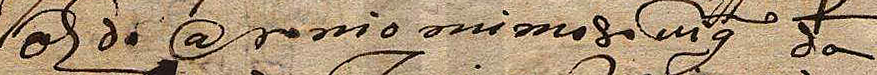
o Ldo a̅tonio mimoso uigro da
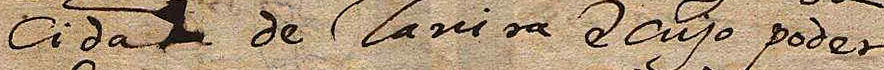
Cidade de Tauira e̅ cujo poder
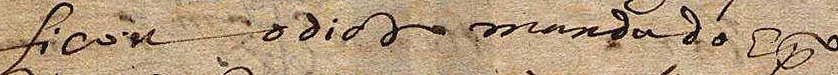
ficou o dicto mandado E p̅o
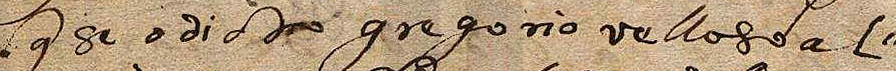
q̅ se o dicto gregorio velloso aL
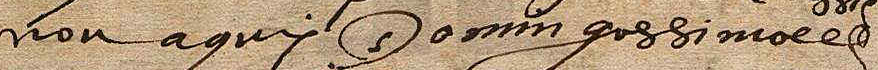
nou aquy Domingos simoees
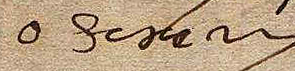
o screuy
